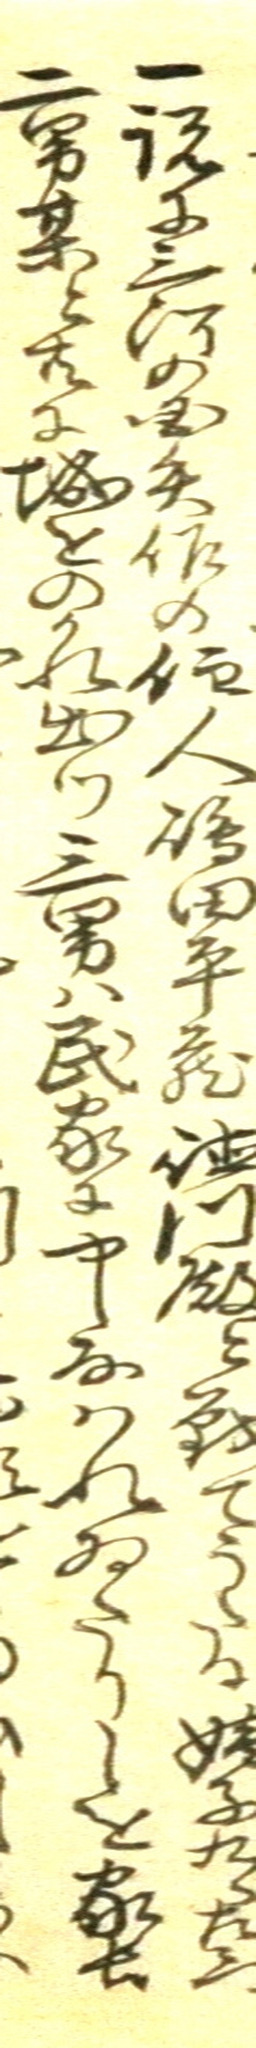二男某と共に城をのかれ出ツ三男は民家にやしなはれゐたりしを家長
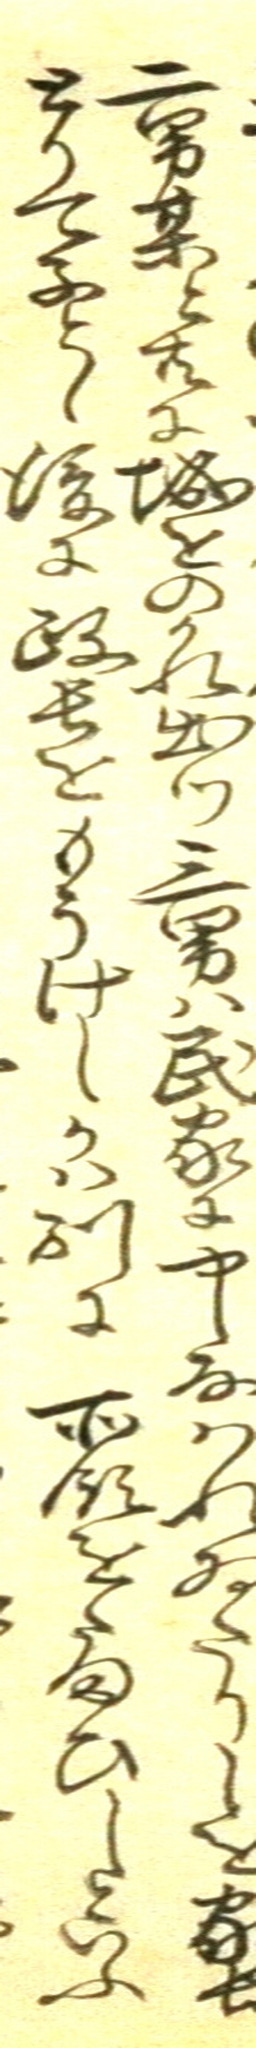とりて子とし後に政長をもうけしかは別に所領をたまひしといふ
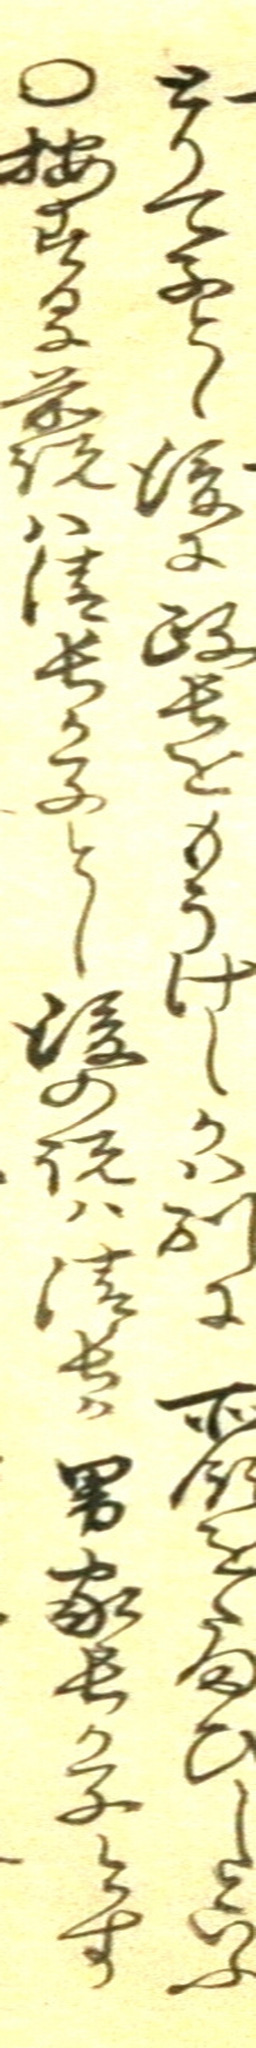〇按するに前説は清長か子とし後の説は清長か男家長か子とす
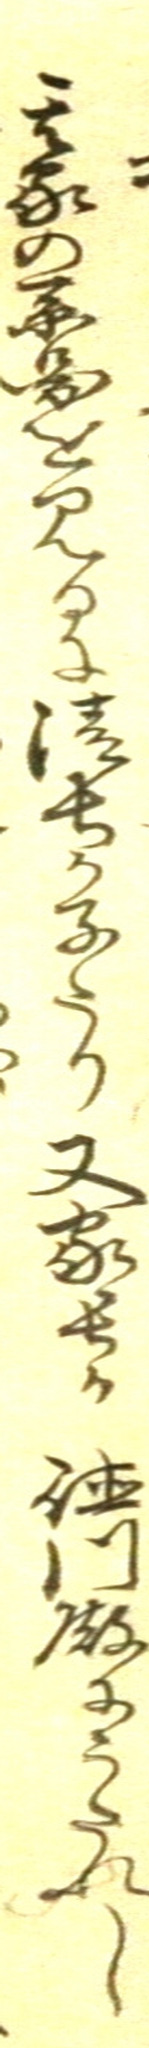其家の系図を見るに清長か子たり又家長か徳川殿にうたれし
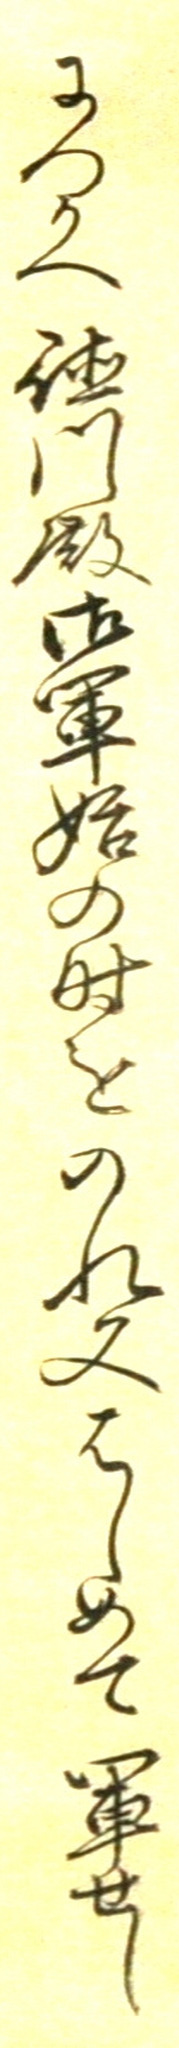につかへ徳川殿御軍始の時をのれ又はしめて軍せし

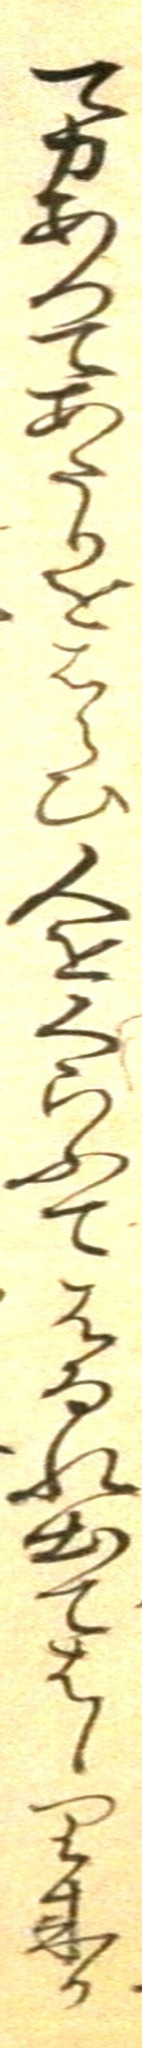て力あつてあたりをはらひ人をくらふてはなれ出てはしり来り
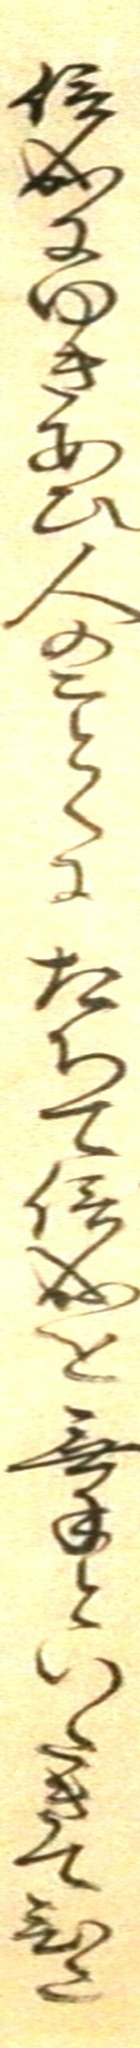信成にゆきあひ人のことくにたちて信成を無手といたきてひた
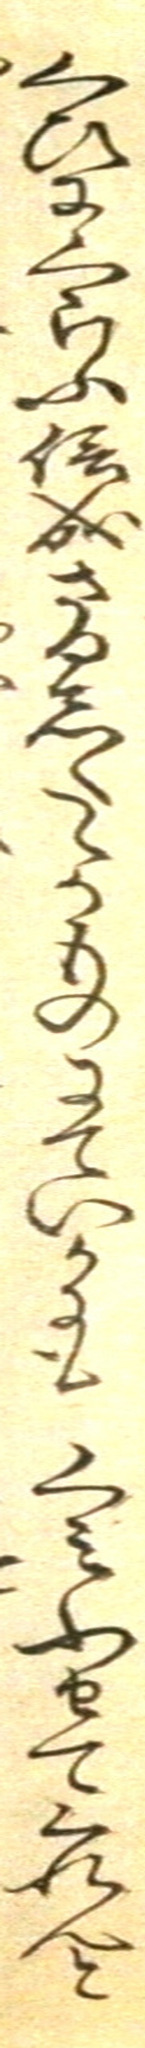くひにくらふ信成さるしたゝかものにていかにもくみふせてくれんと
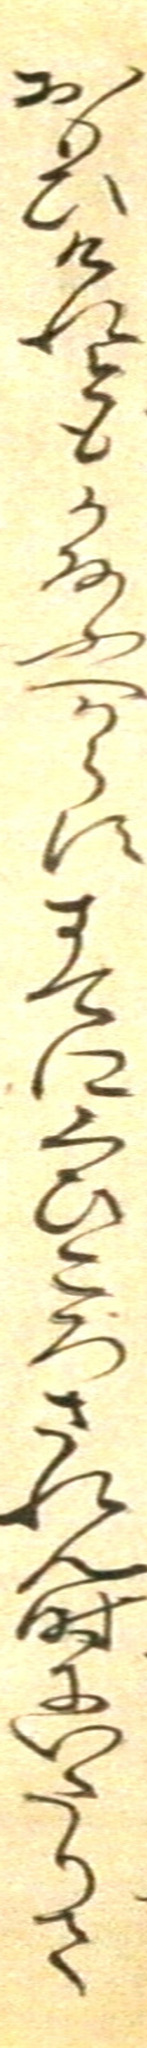おもひけれともかなふへからすすてにくひころされん時にいたりて
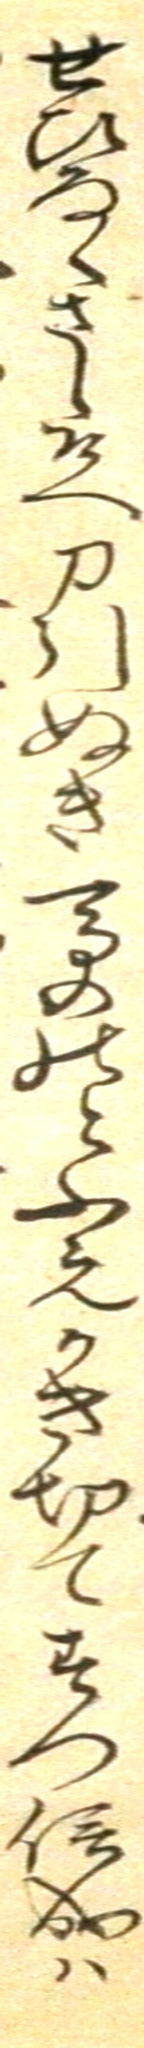せひなくさしそへ刀引ぬき馬ののとふへかき切てすつ信成は
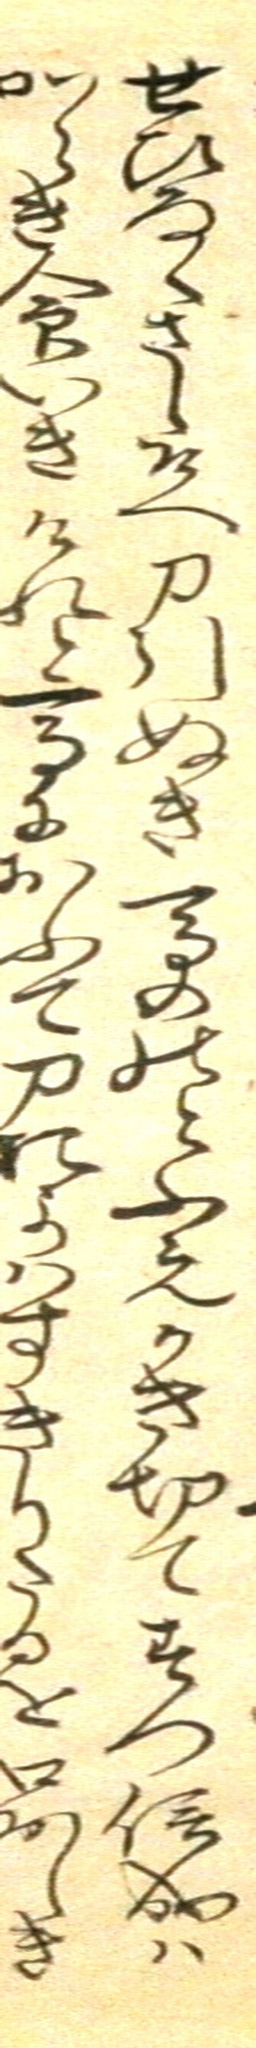からき命いきけれと馬におふて刀およはすきりたるを口おしき
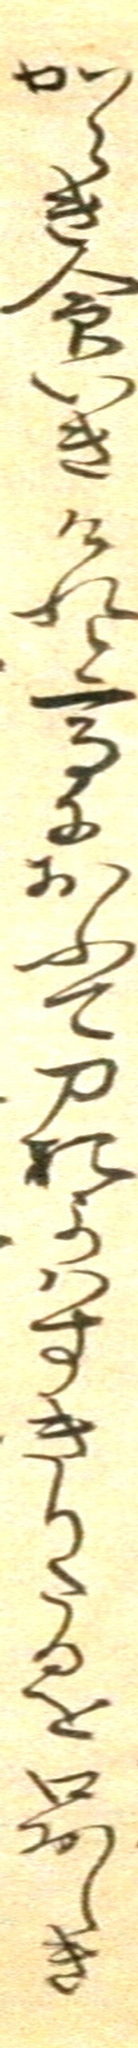からき命いきけれと馬におふて刀およはすきりたるを口おしき
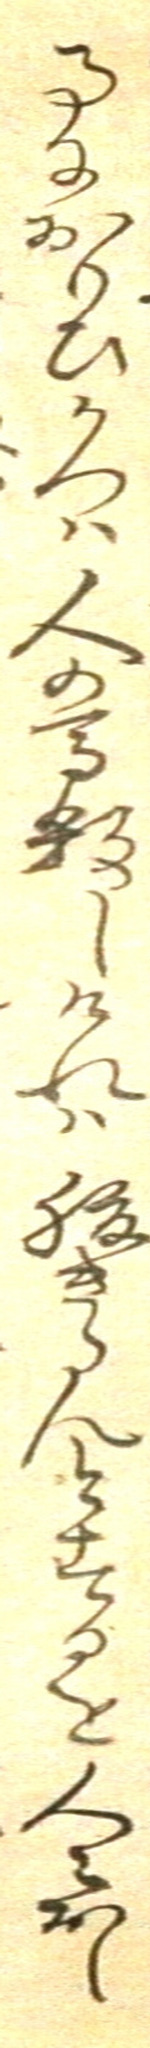事におもひかつは人の馬殺しけれは腹きらんとするを人々おし
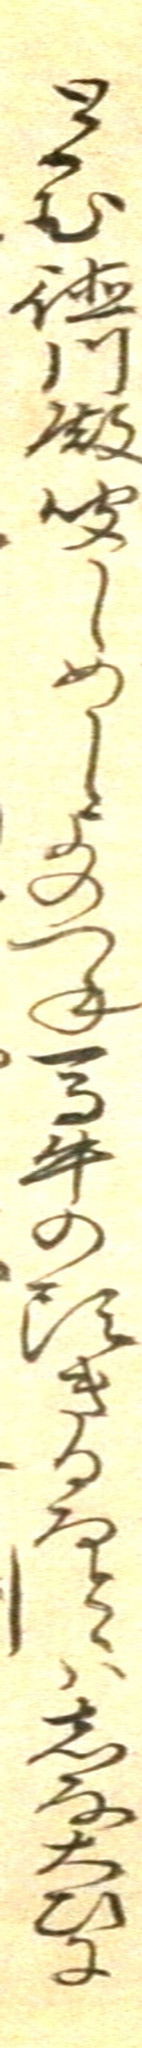とゝむ徳川殿聞しめしよのつね馬牛の頭きるなとゝはしな大ひに
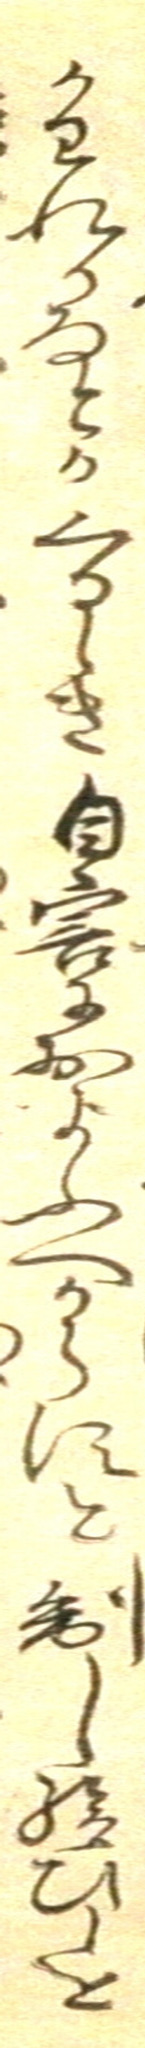かわれりなとかくるしき自害におよふへからすと制し給ひしを
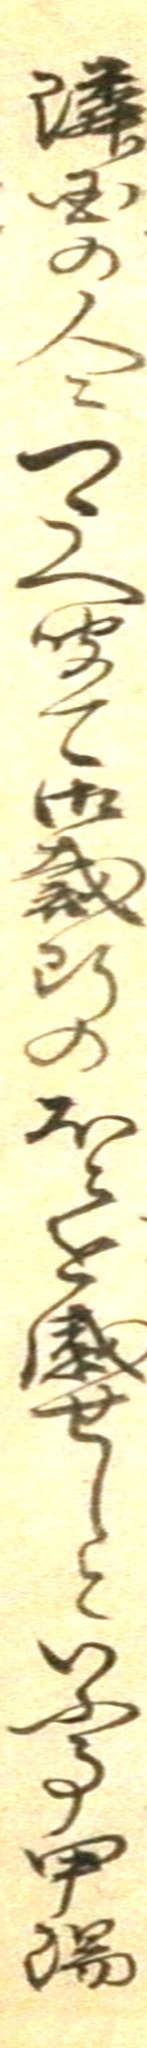隣国の人々つたへ聞て御裁断のほとを感せしといふ事甲陽
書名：藩翰譜（四・中）
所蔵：伊那市立高遠町図書館・合同会社AMANE
